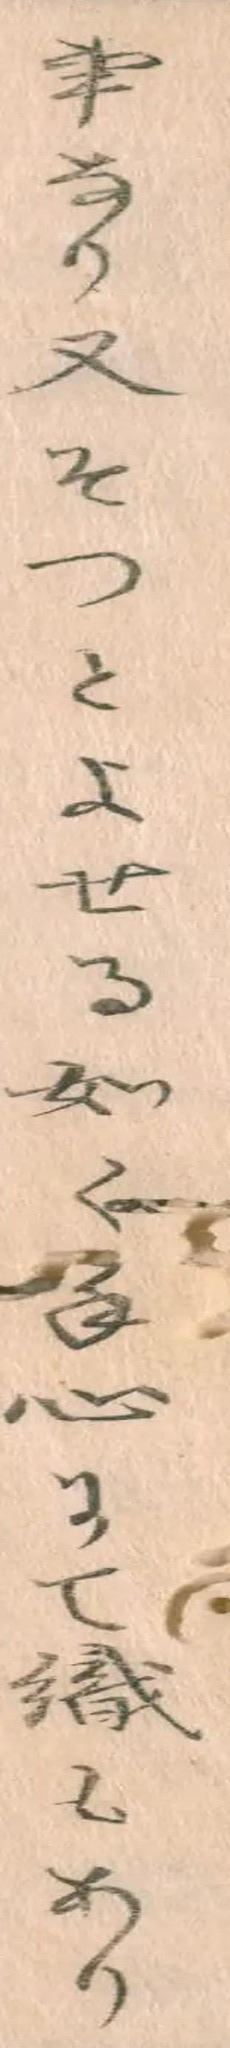事なり又そつとよせる如く手心にて織もあり
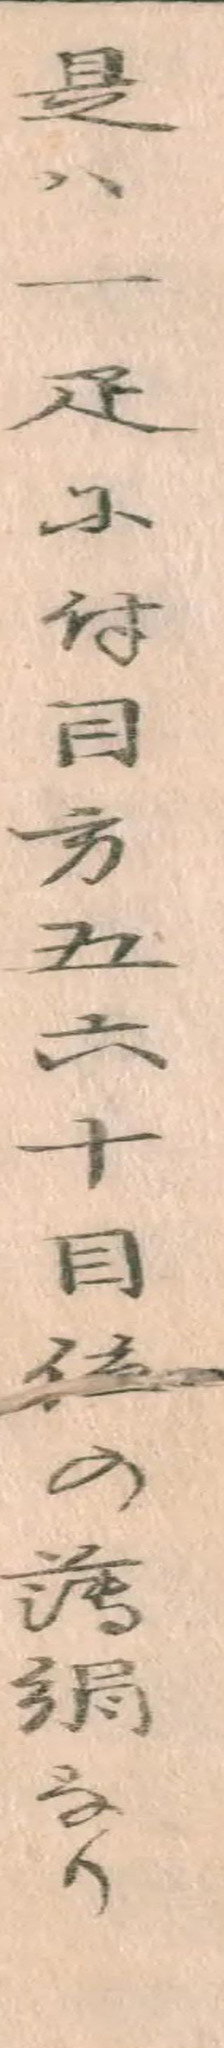是は一疋に付目方五六十目位の薄絹なり
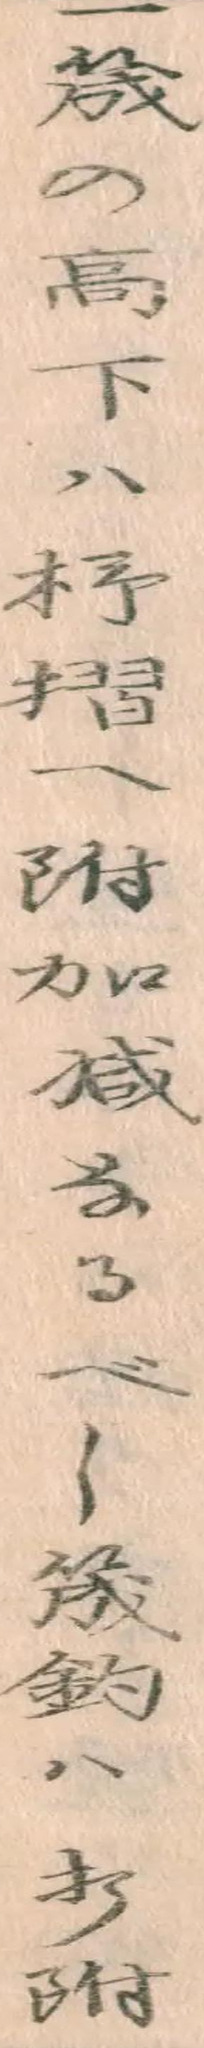一筬の高下は杼摺へ附加減なるべし筬釣は打附
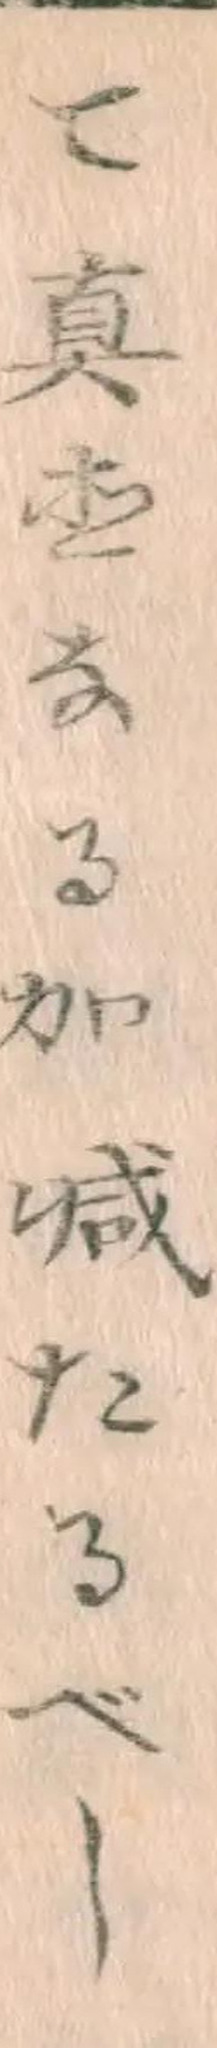て真直なる加減たるべし
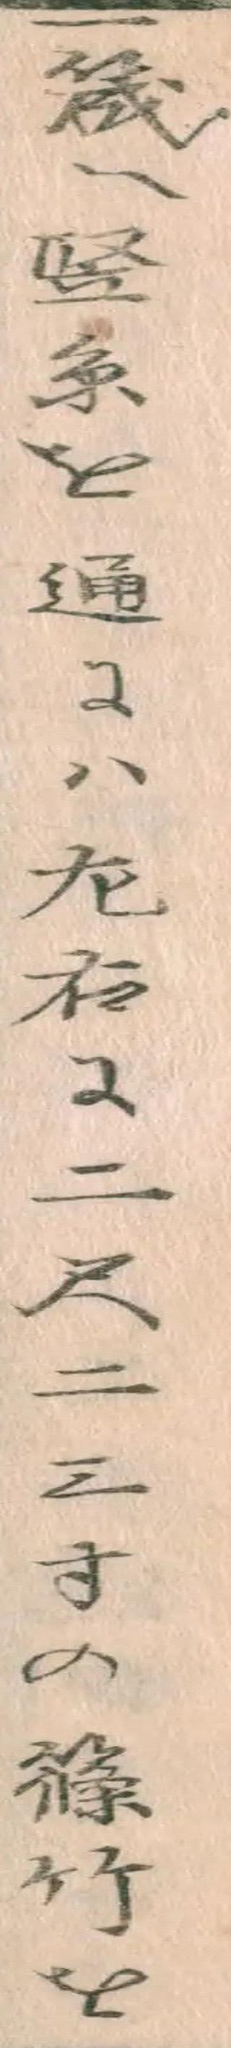一筬へ竪糸を通には左右に二尺二三寸の篠竹を
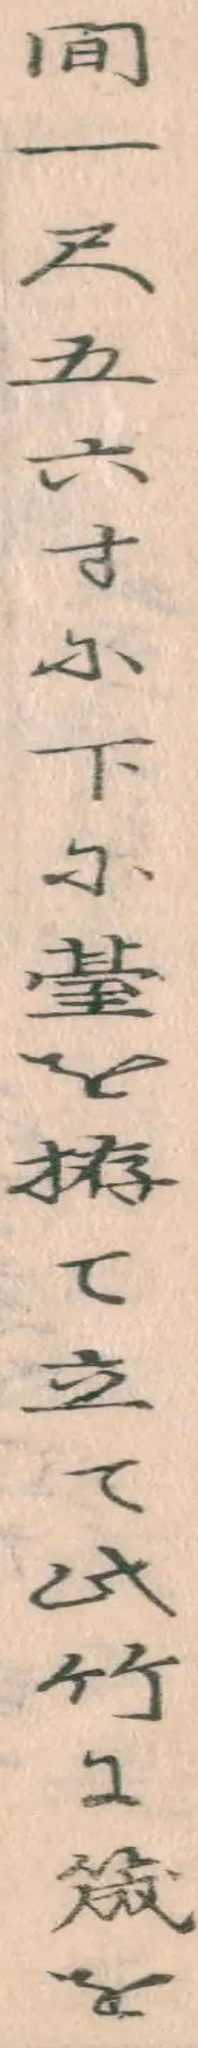間一尺五六寸に下に台を拵て立て此竹に筬を
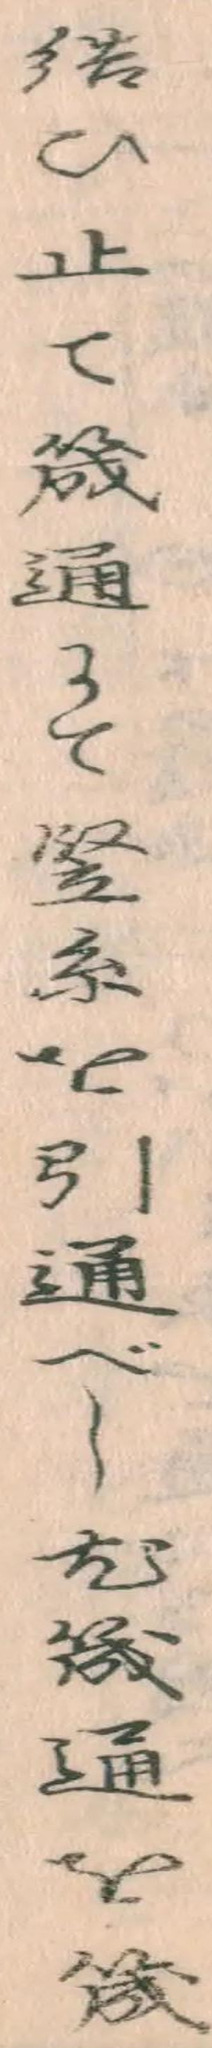結ひ止て筬通にて竪糸を引通べし尤筬通を筬
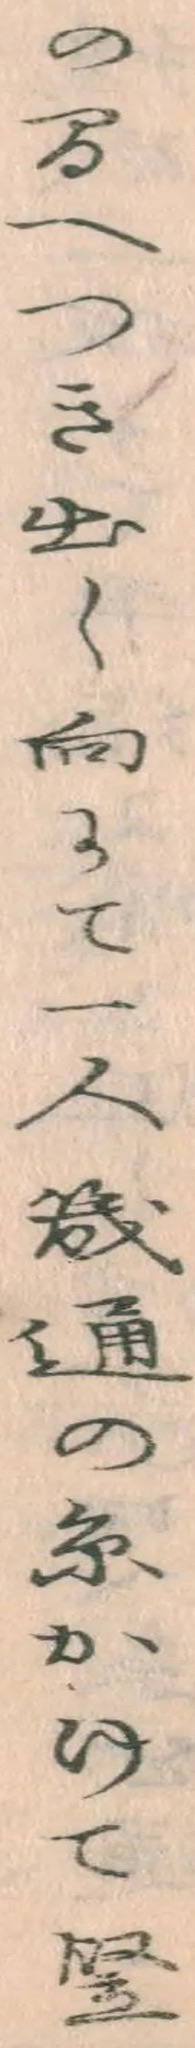の間へつき出し向にて一人筬通の糸かけて竪
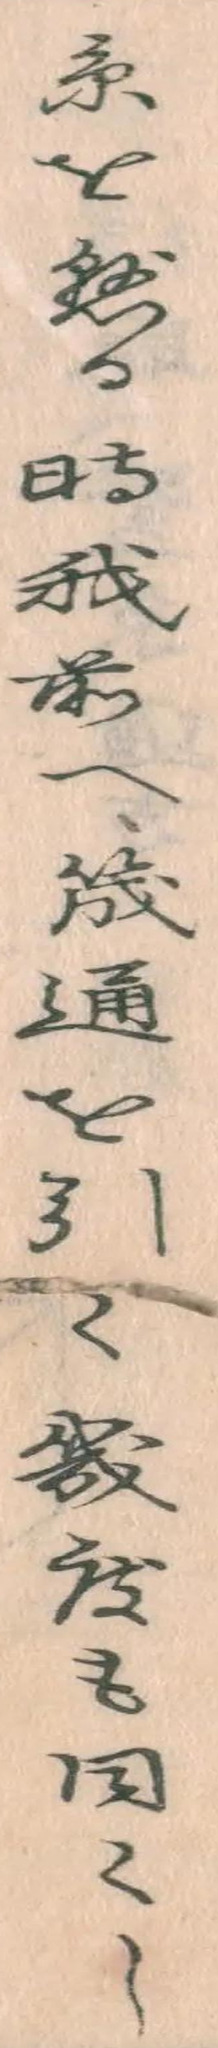糸を懸る時我前へ筬通を引く幾度も同くし
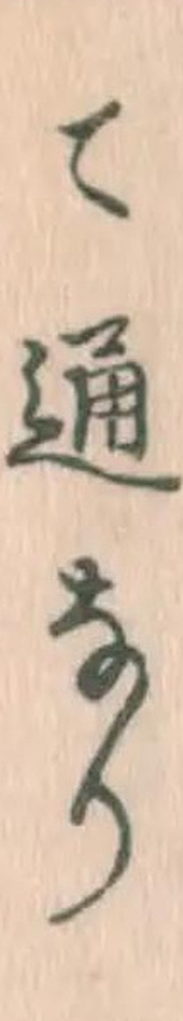て通なり
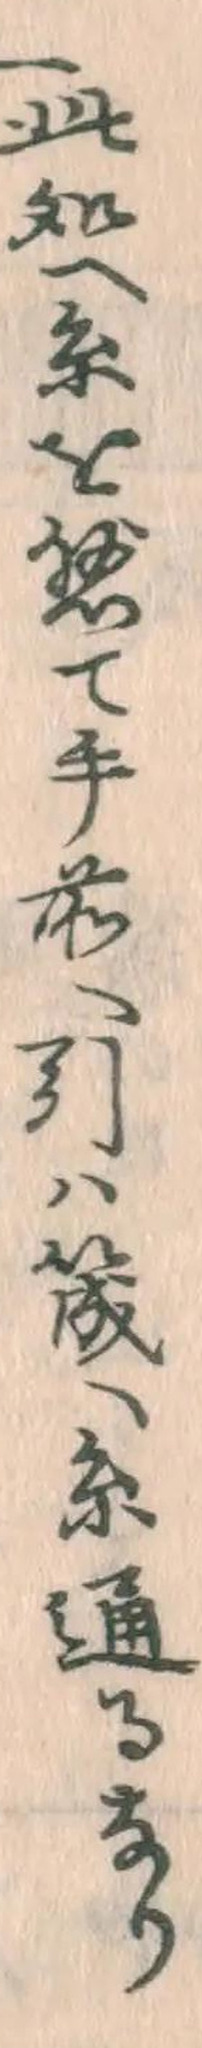此処へ糸を懸て手前へ引は筬へ糸通るなり

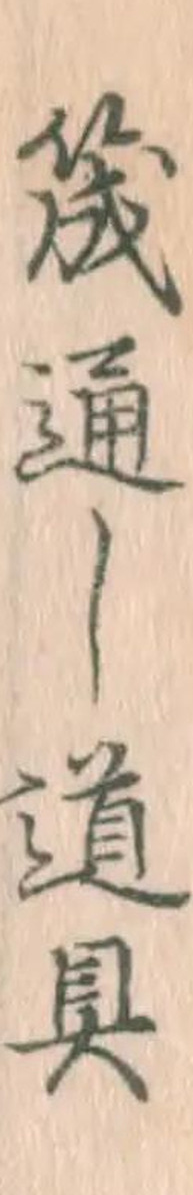筬通し道具
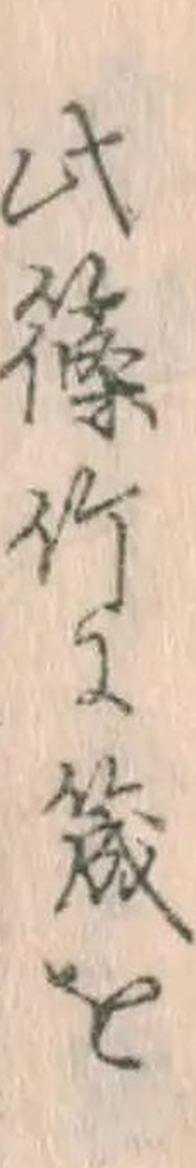此篠竹に筬を
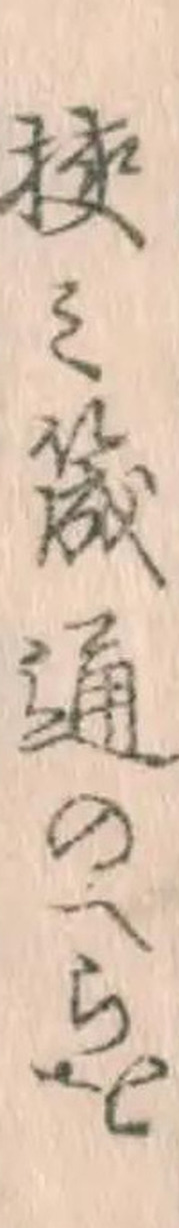挟み筬通のへらを
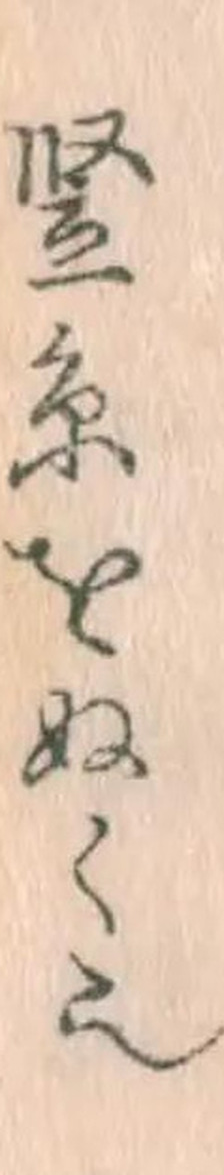竪糸をぬく也
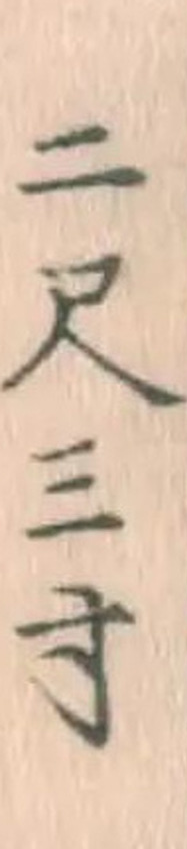二尺三寸
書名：機織彙編 5巻. [2]
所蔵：国立国会図書館 National Diet Library, JAPAN
